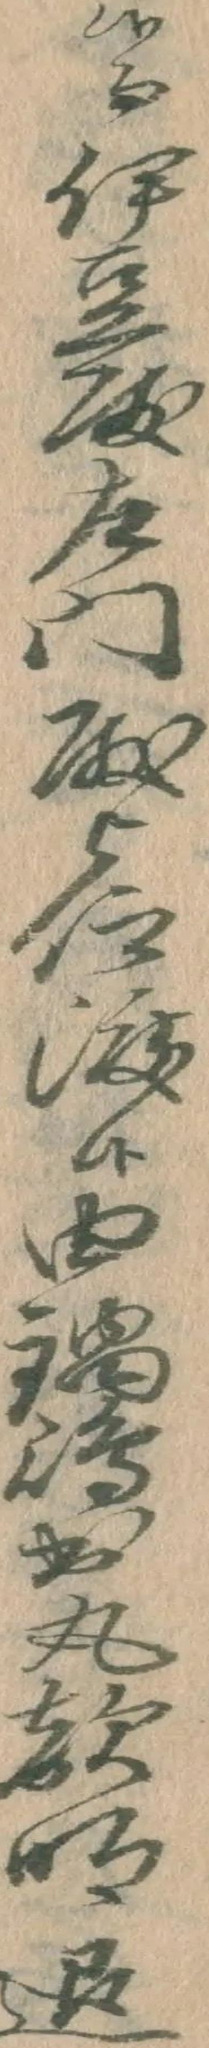候而伊豆殿左門殿被仰渡候由鍋島出丸敵明退
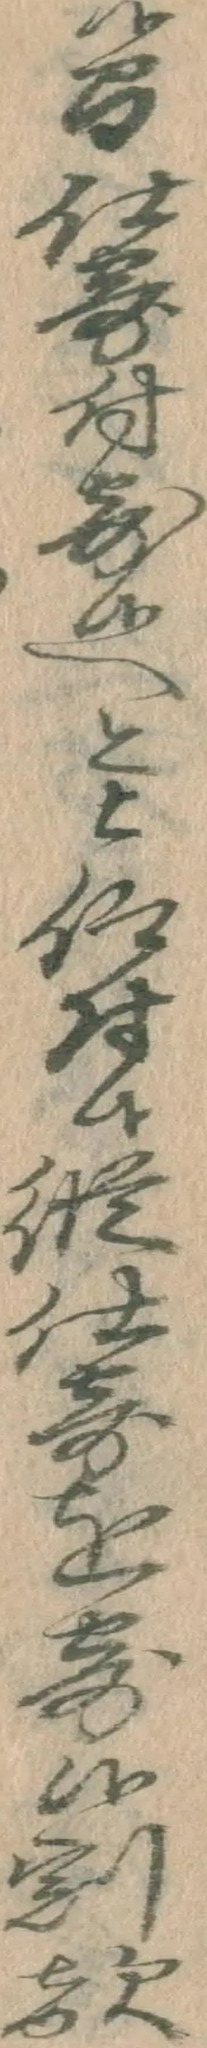候間仕寄付寄候へと被仰付候縦仕寄を寄候割敵
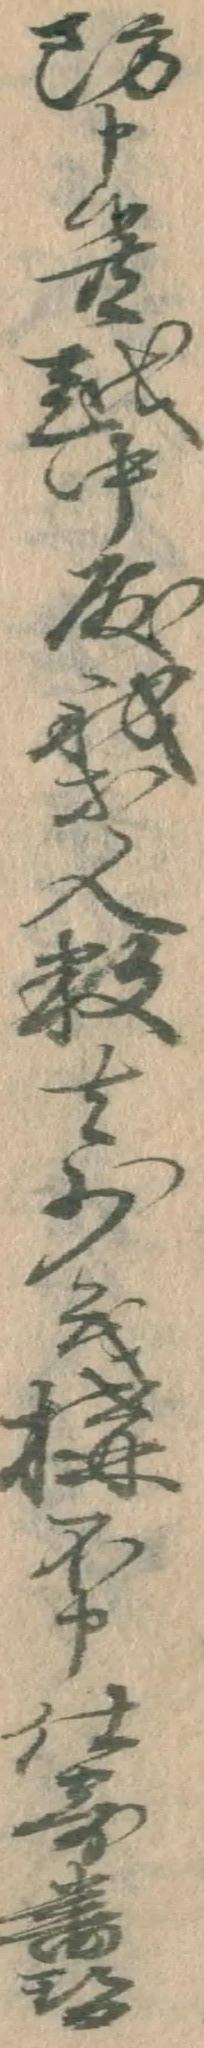防申候共越中殿我等人数者少茂構不申仕寄番替
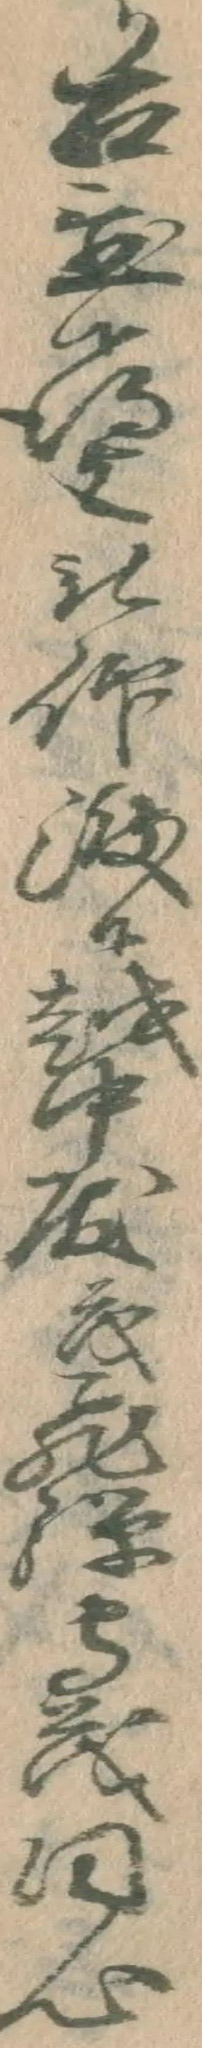り右置候得者被仰渡候越中殿茂飛騨守茂同心
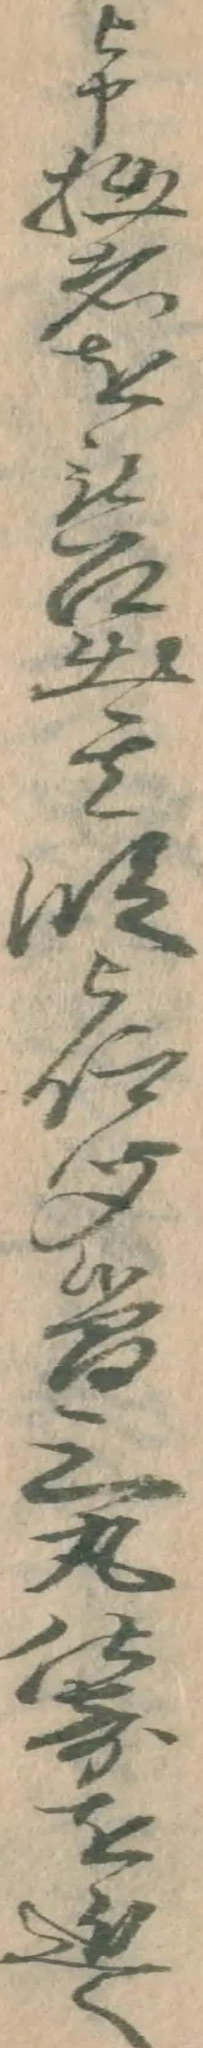被申拙者を被召出其段被仰聞候間三丸仕寄を近へ
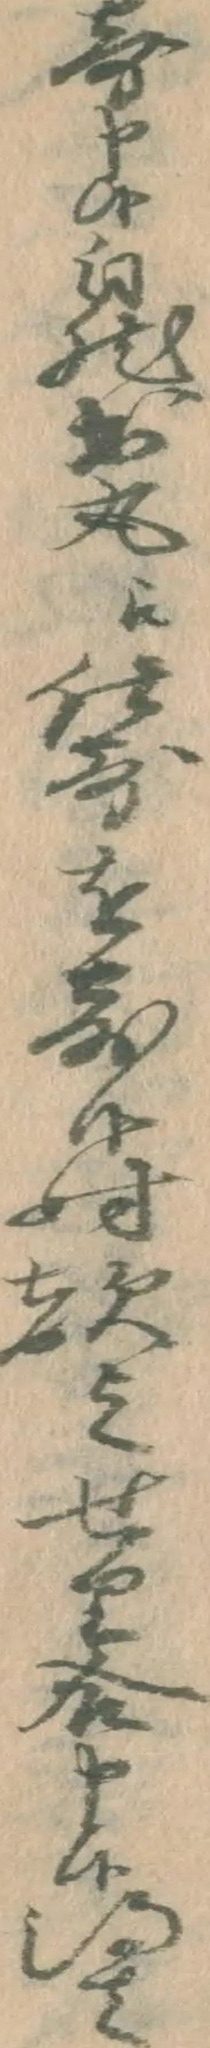寄申候自然出丸江仕寄を寄候時敵与せ里合申候得者

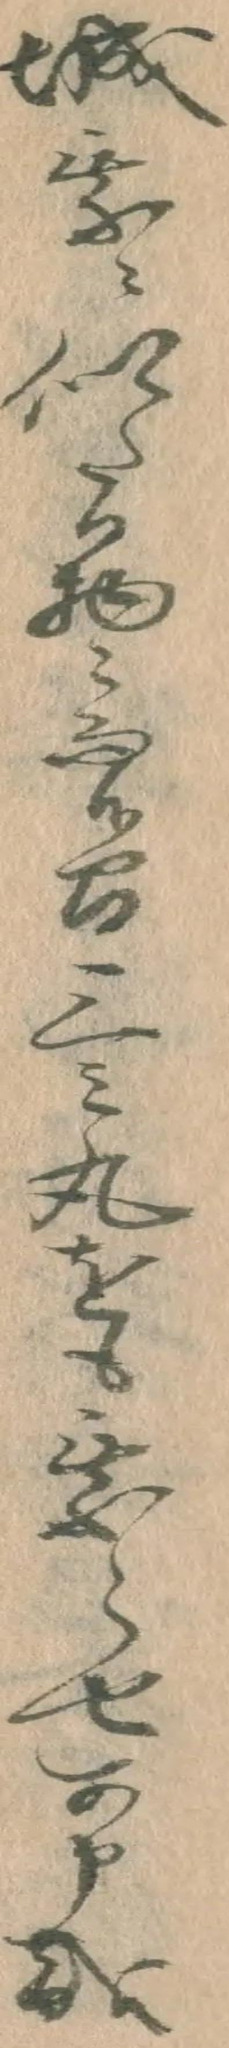城乗に似たる物に而候間三之丸をも乗らせ可申哉
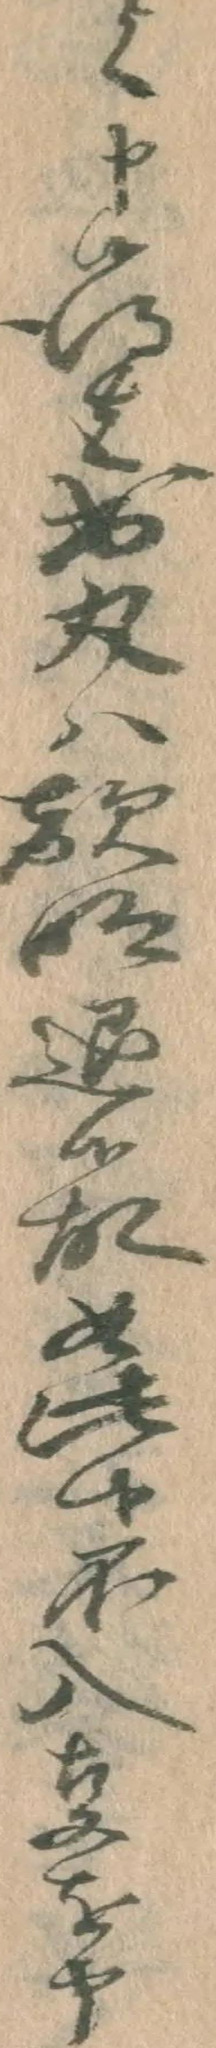与申候得者出丸は敵明退候故如此候不入事を申
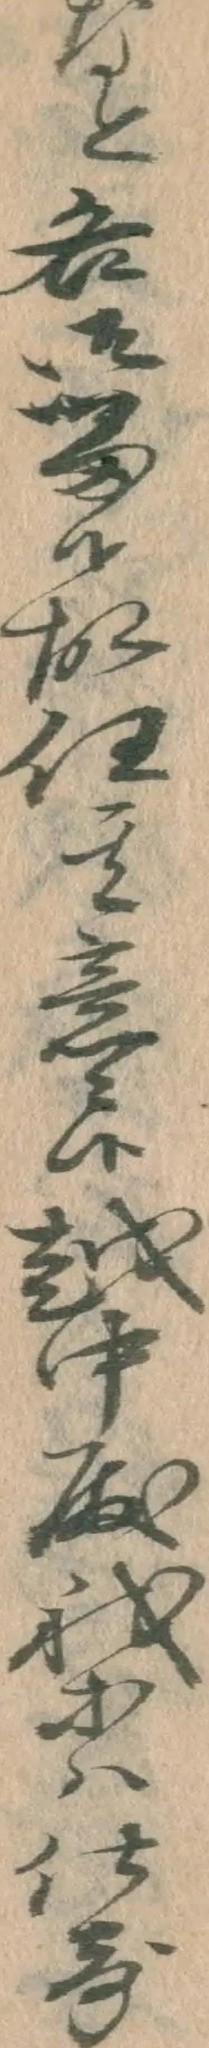なと各御留候故任其意に候越中殿我等は仕寄
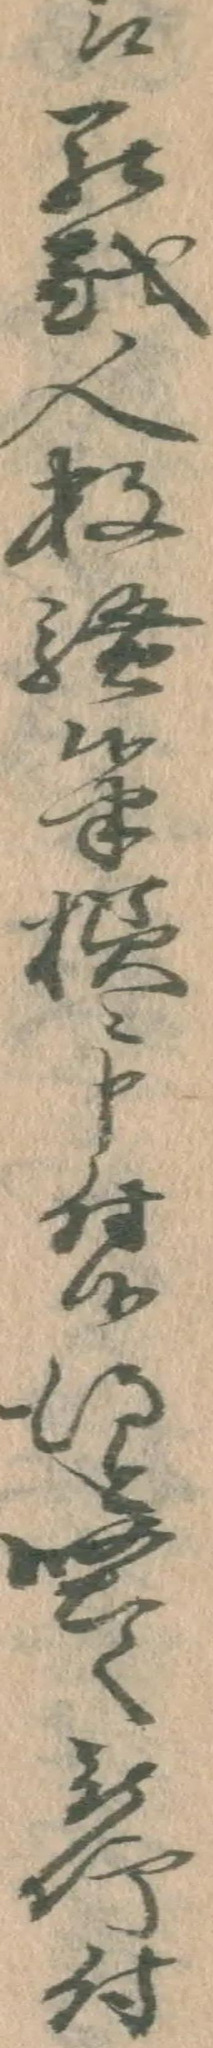江罷越人数騒候半様に申付候得と堅く被仰付
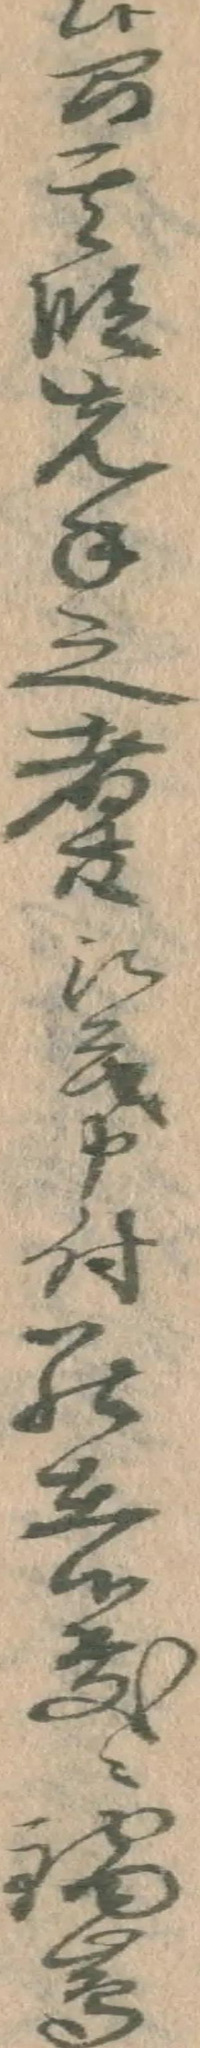候間其段先手之者共江茂申付罷在候處に鍋島
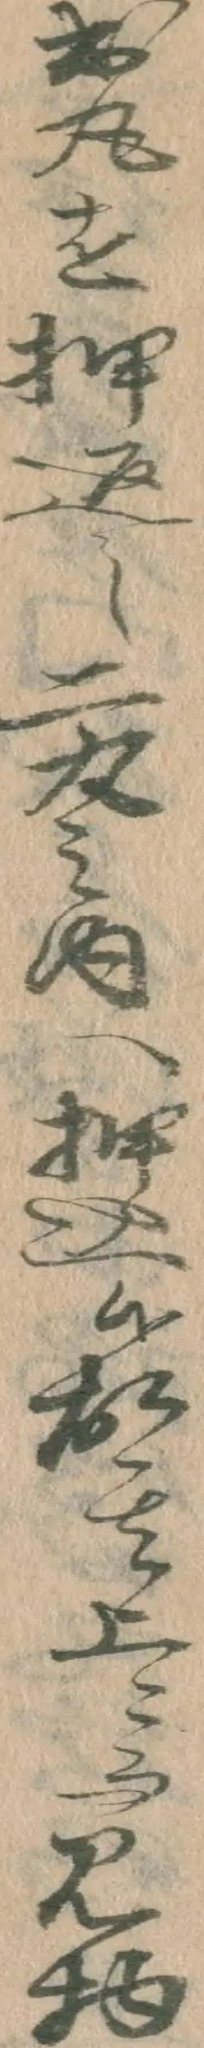出丸を押返し二丸之内へ押込候故其上に而見物
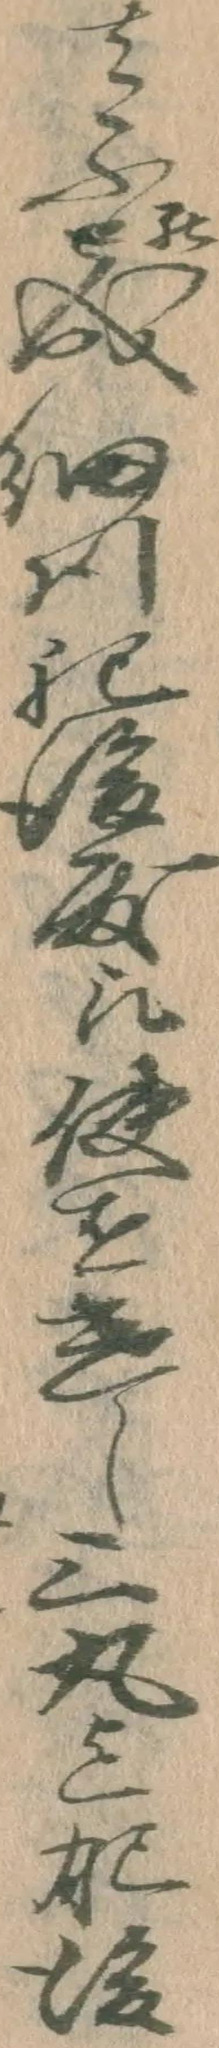者ふ被成細川肥後殿江使を遣し三丸迄肥後
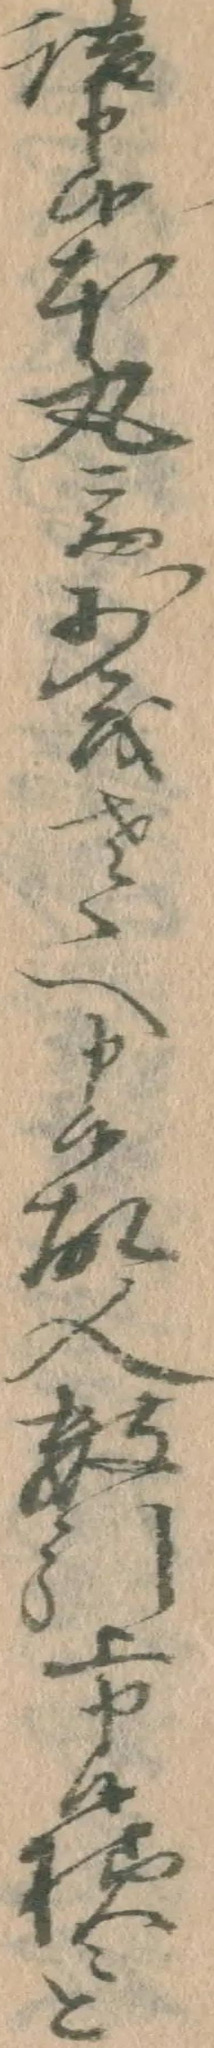詰申候本丸に而少茂さゝへ申候故人数引上申候様にと
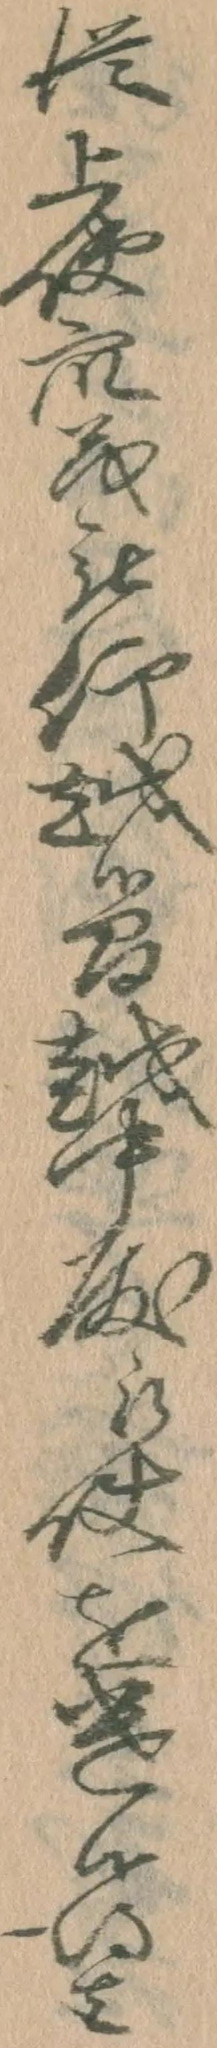従上使衆茂被仰越候間越中殿被使を遣候得者
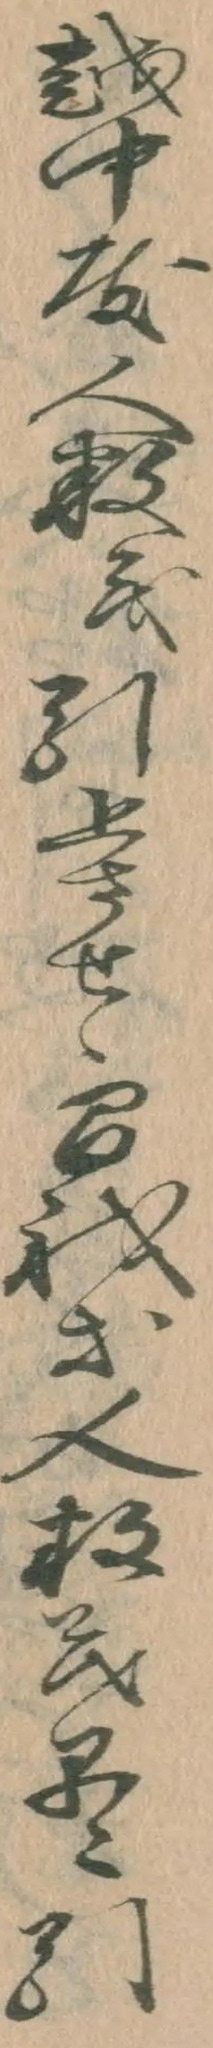越中殿人数茂引上させ候間我等人数茂早々引
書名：切支丹御退治記 49巻. [8]
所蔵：国立国会図書館 National Diet Library, JAPAN
